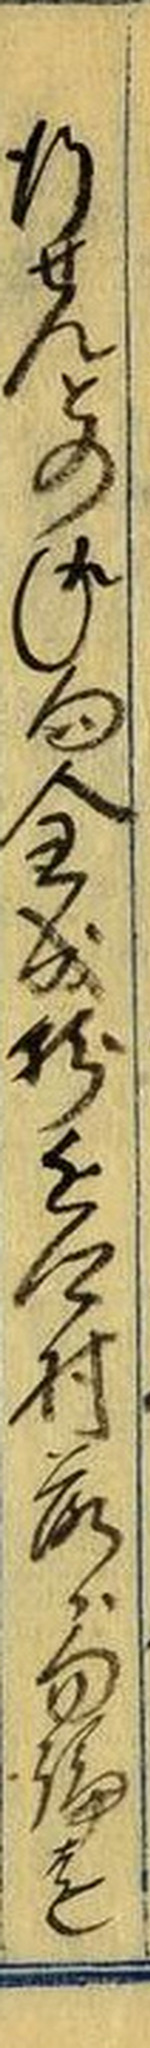行せんとの趣向全成就を郷村落ハ勿論遠
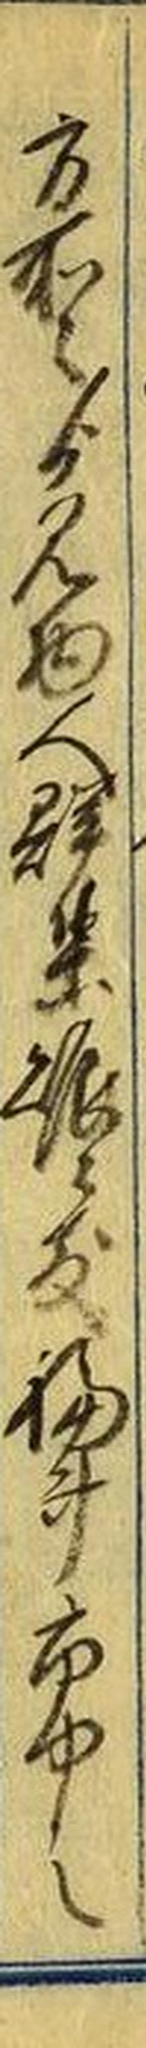方所々ゟ見物人群集賑々敷福井市中之
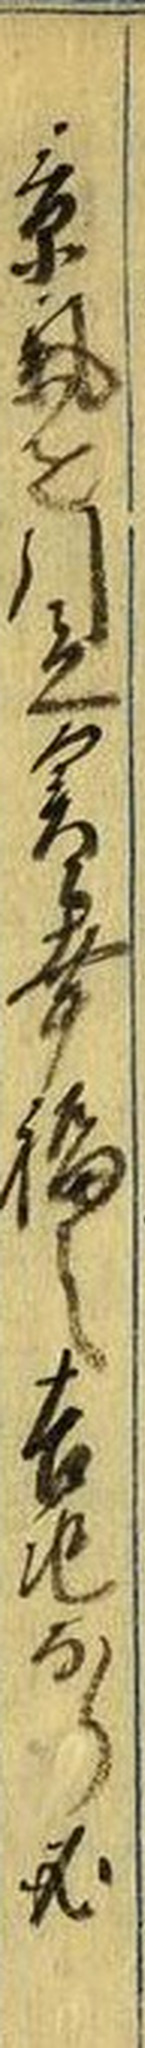景気を引立実ニ幸福之吉兆なり必
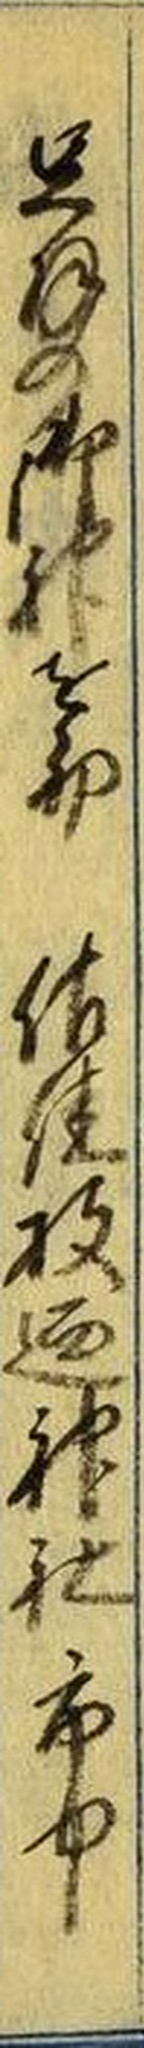足羽の御神を初佐佳枝廼神社市中
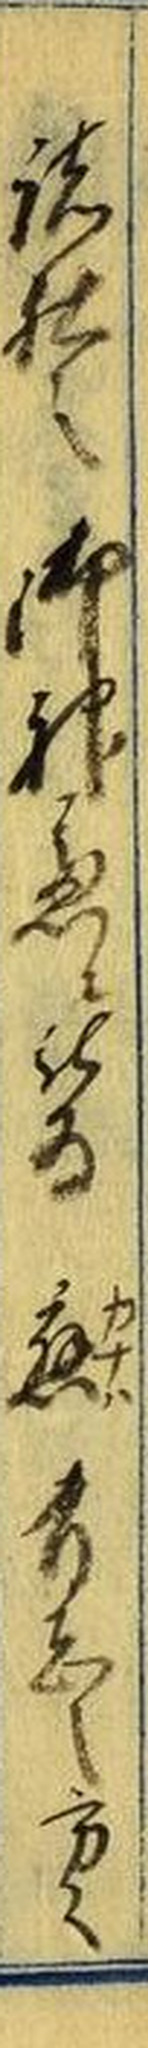諸社之御神慮ニ被為応有志之方々
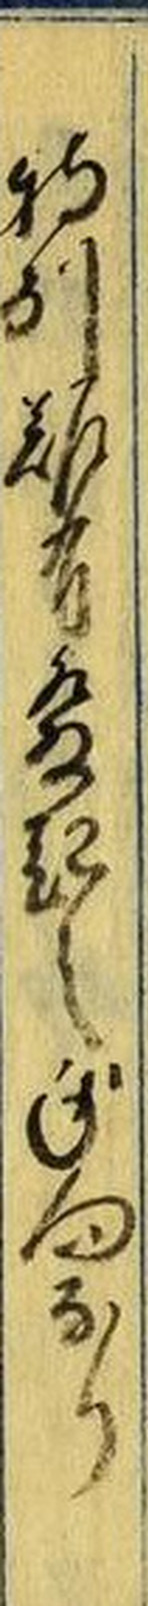特別難有発起之趣向なり
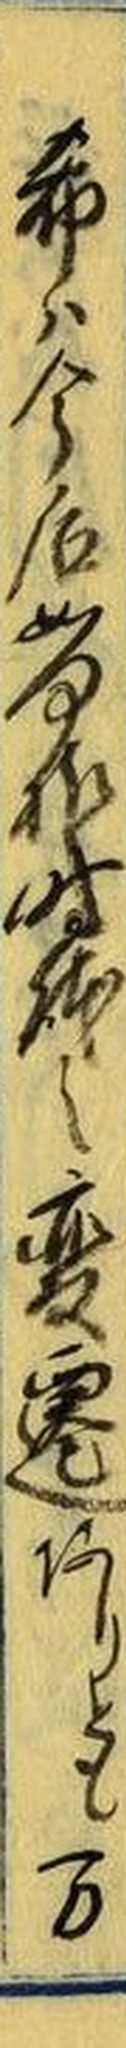希ハ今后如何様時体之変遷ありとも万
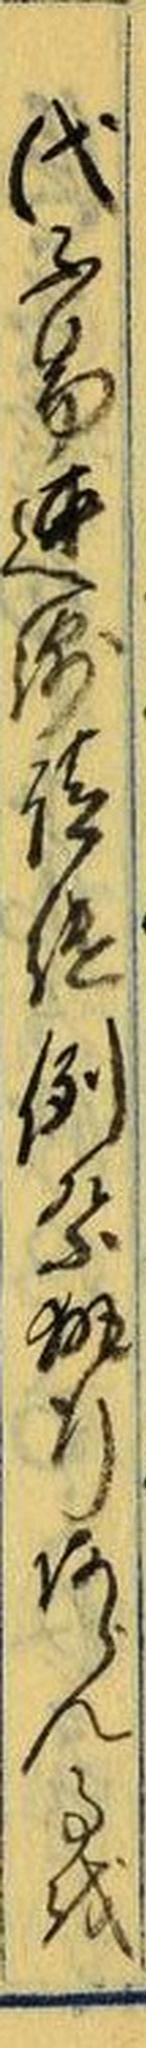代不易連綿請継例祭執行あらん事を
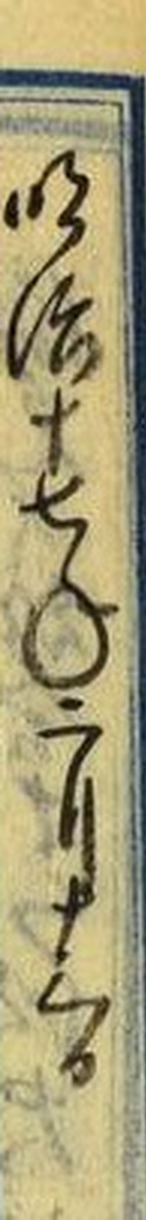明治十七年二月十三日
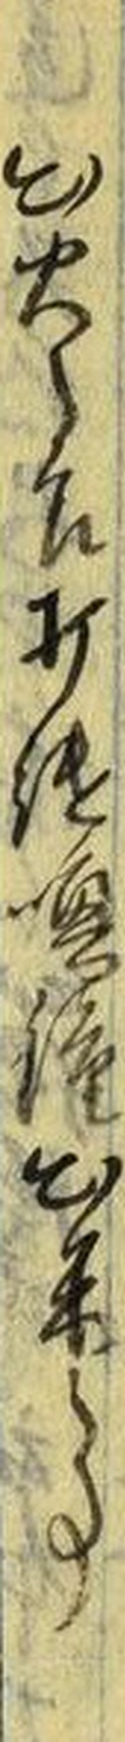出火之節打続喚鐘出来之事
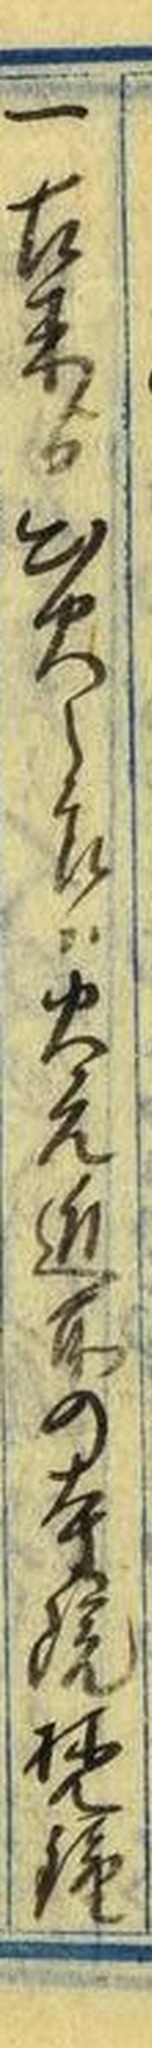一古来ゟ出火之節ハ火元近所の寺院梵鐘
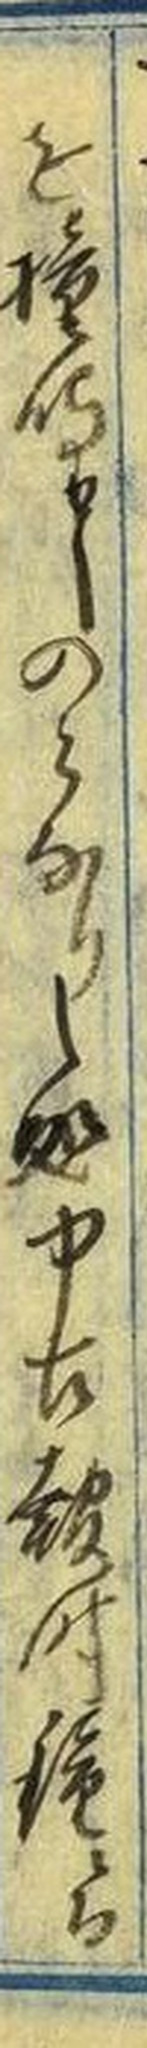撞鳴せしのミなりし処中古報時鐘ニ而
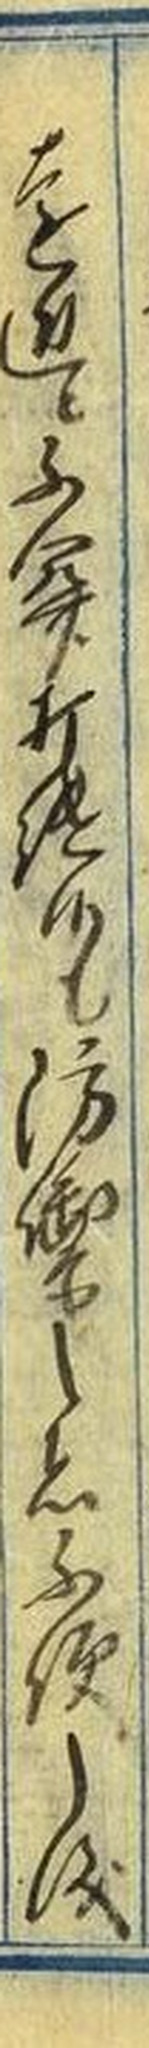遠近に不関打継候も防御之者不便之儀
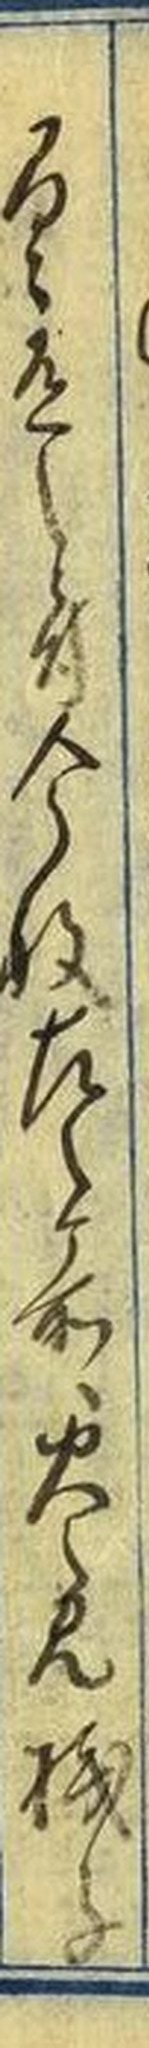間々有しに付今般左之ヶ所へ火之見梯子
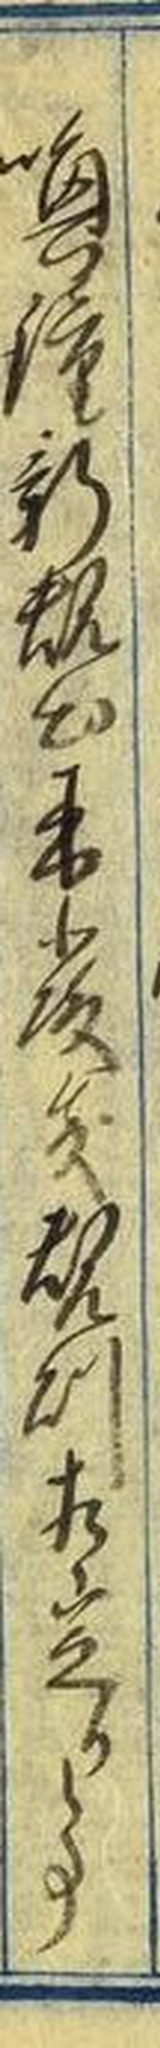喚鐘新規出来厳敷規則相定り之事
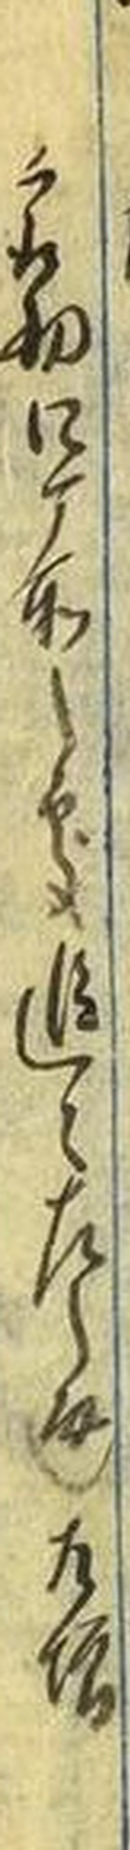最初四ヶ所之処追々左之通相増
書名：温古集 五巻
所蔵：福井県文書館 Fukui Prefectural Archives
